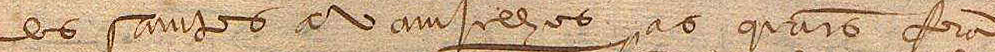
dos samtos avamJelhos as quaes forā
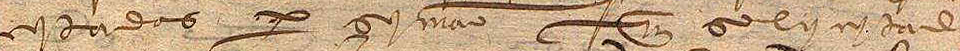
cytadas ꝑ symão fr̄z solycytador
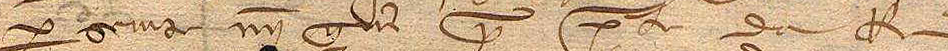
ꝑsemte n̄yguē p̄o p̄te da Re
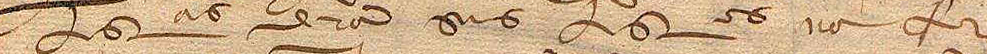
testas derā seus testos na for
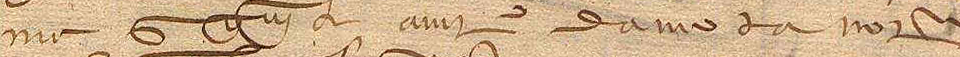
ma seguj̄te amto da mota notro
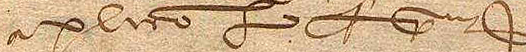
aplicō ho sꝑuj
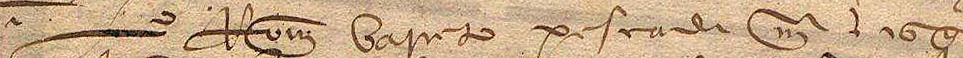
item Jo Rōiz barreto pescador mor ē esgra
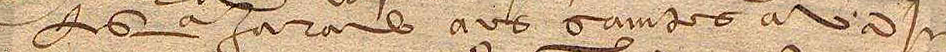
testa Jurado aos samtos avāJe
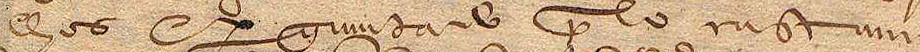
lhos e ꝑgumtado p̄lo custume
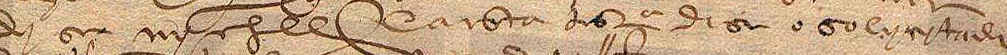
djse nychell e a esta testa dise o solycytador
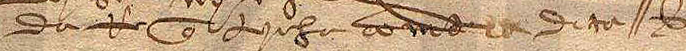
da Re q̄ tynha comtradita //
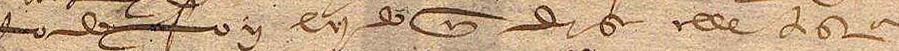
todo foy lydo q̄ djse elle testa
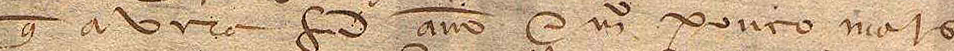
q̄ avera hū āno e mo pouco maJs
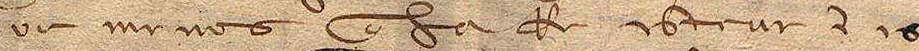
ou menos q̄ ha Re esteue ē es
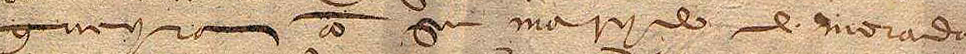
gueyra c̄o seu marydo de morada
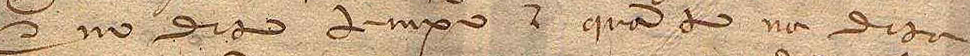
e no dito tempo ē quāto na dita
